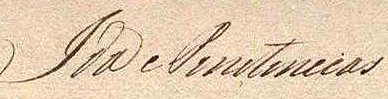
Ida e Penetencias
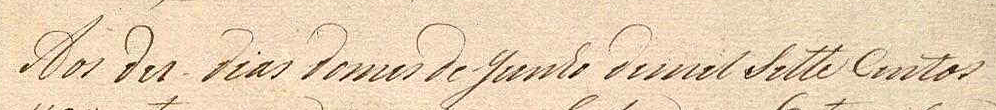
Aos des dias do mes de Junho de mil SetteCentos
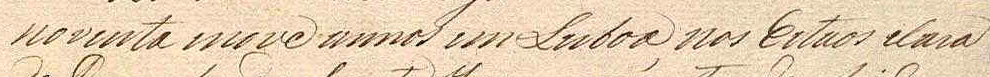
noventa e nove annos em Lisboa nos Estaos e caza
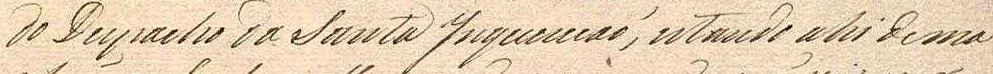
do Despacho da Santa Jnquizicaõ, estando ahi de ma
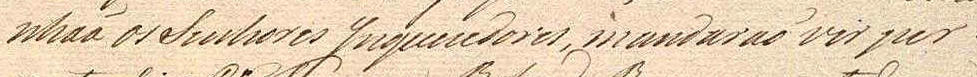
nhaã os Senhores Jnquizidores, mandaraõ vir per
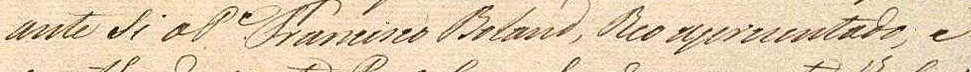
ante Si o P.e Francisco Boland, Reo aprezentado, e
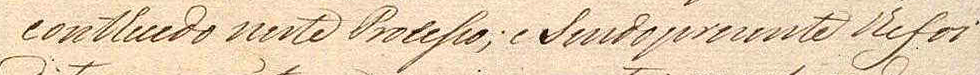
contheudo neste Processo; e sendo prezente lhe foi
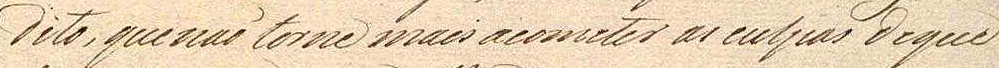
dito, que naõ torne mais a cometer as culpas de que
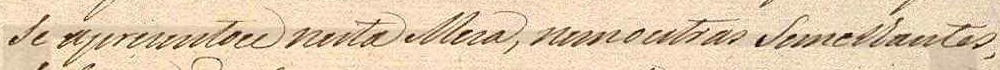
se aprezentou nesta Meza, nem outras semelhantes
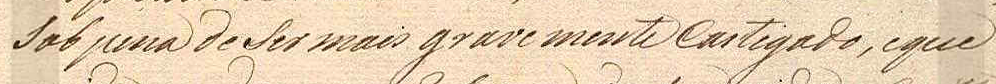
sob pena de ser mais gravemente castigado, e que
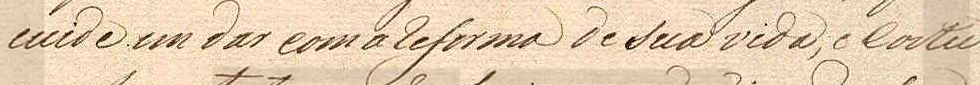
cuide em dar com a Reforma de sua vida, e Costu
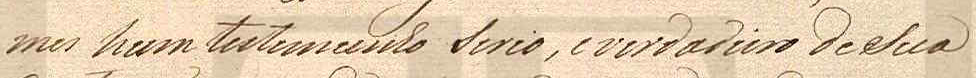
mes hum testemunho serio, e verdadeiro de sua
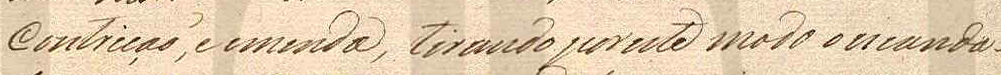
contriçaõ, e emenda, tirando por este modo o escanda
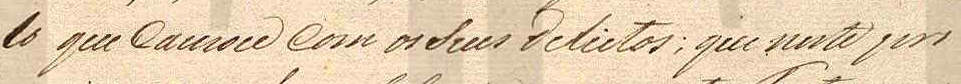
lo que cauzou com os seus delictos; que neste pri
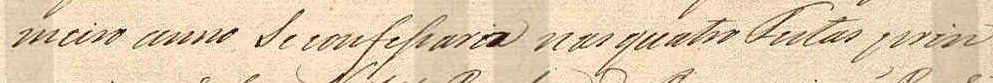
meiro anno se confessaria nas quatro Festas prin
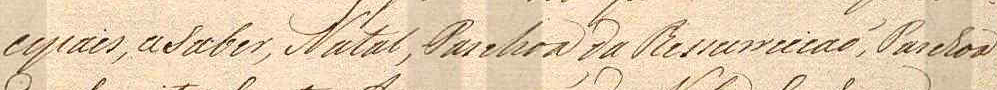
cipais, a saber, Natal, Paschoa da Ressurreicaõ, Paschoa
